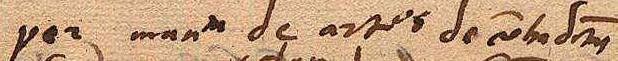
por manra de artos de c̄otradit̄as
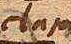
clara
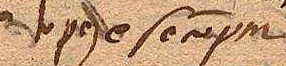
lopez e se cōprir
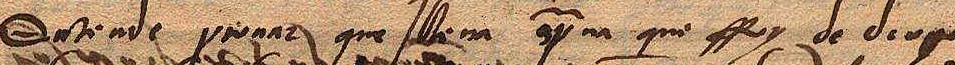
Entende prouar que Jllena ēspua que ffoy de diogo
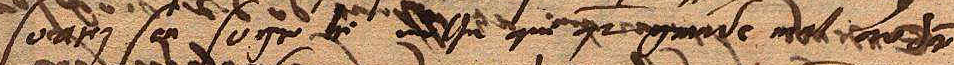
soarez seu sogro he molher que q̄r grande mal ao dito
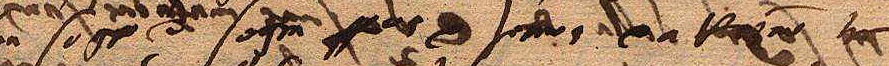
seu sogro e sogra ffos e Jerros e a Rezão he
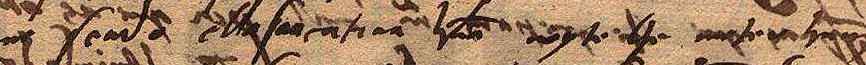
que sendo ella sua catiua hūa noyte lhe meteu hum
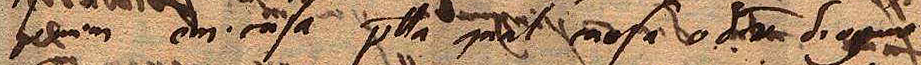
homem em casa p̄lla qual caosa o dito dioguo
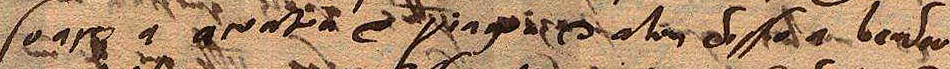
soarez a acoutou e pingou e alem disso a vendeo
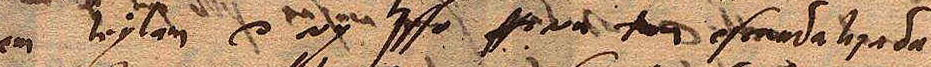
em leylam e coy Jsso fficou tam escandalizada
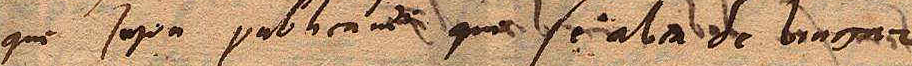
que Jurou publicamte que se avia de vingar
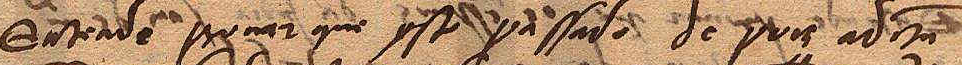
Entende prouar que ysto passado de pois a dita
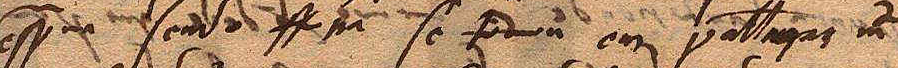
ēspua sendo fforra se tomou com pālluras mto
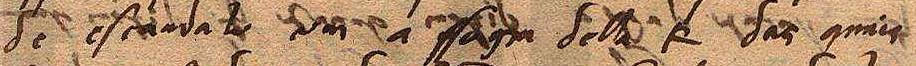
de escandalo com a ssogra della R das quais
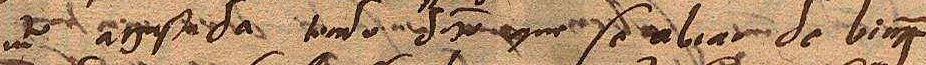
mto agastada tendo dito que se avia de vinḡ
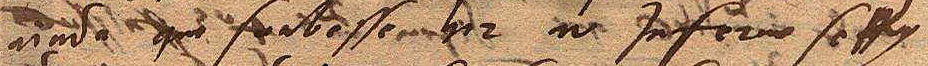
ainda que se ovesse hir ao Jnferno se ffoy
